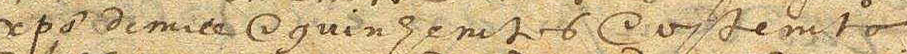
xpō de mill e quinhemtos e ojtemta
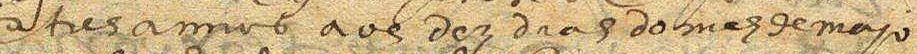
e tres annos aos dez dias do mes de majo
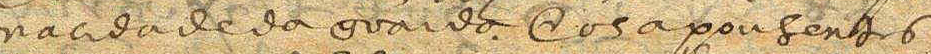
na cidade da goarda ē os apousentos
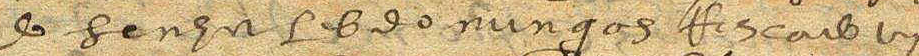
do senhor Ldo domingos Riscado vy
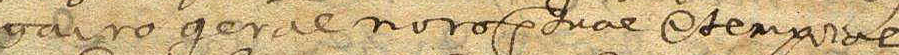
gairo geral no esp̄tual e temporal
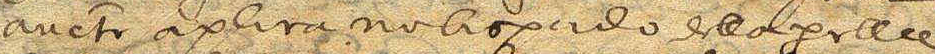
auct̄e aplica no bispado della ꝑ ellee
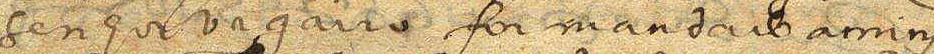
senhor vigairo foi mandado a mim
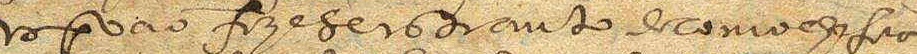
esp̄vaõ fizese este auto de como lhe fora
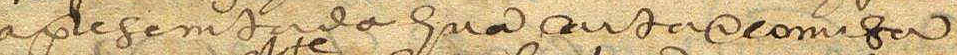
apresemtada huā carta e comisā
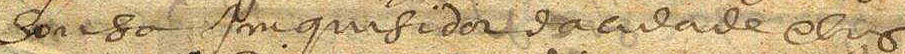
Sousa Jmquisidor da cidade e bis
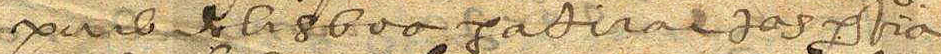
pado de lisboa ꝑa tirar tas ꝑ via
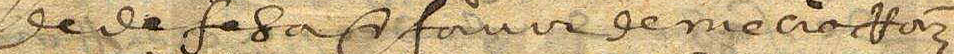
de defesa ē fauor de mecia Roiz̄
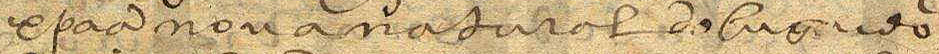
xpaā noua natural do lugar do
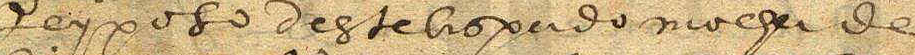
teyxoso deste bispado molher de
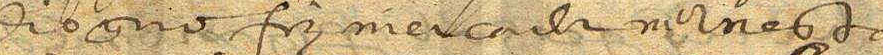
dioguo frz̄ mercador mor nesta
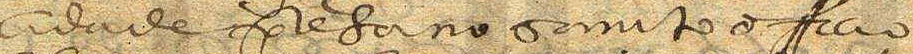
cidade presa no samto officio
